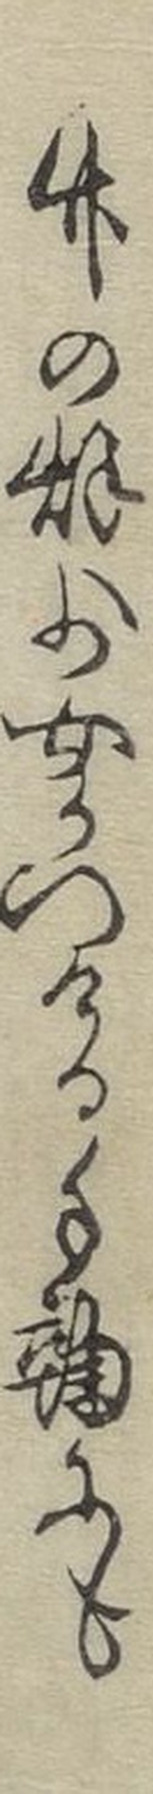竹の秋少女かつける手鞠にも
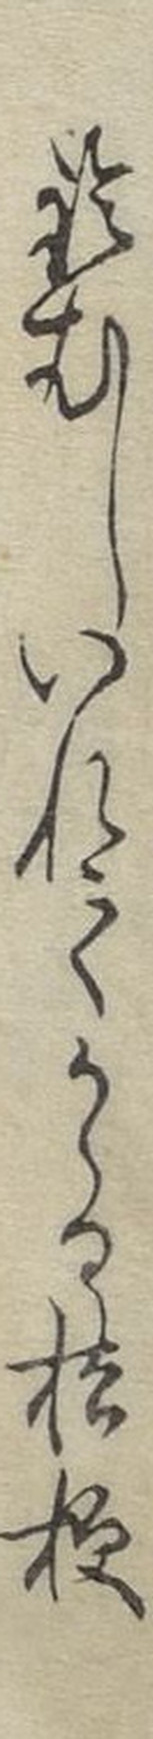鈴むしいれてかゝる桔梗
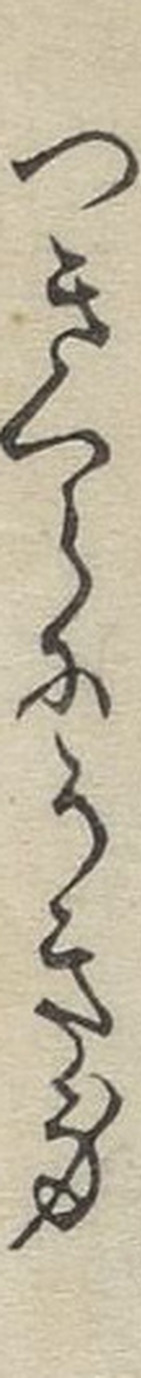つきくらにうき身
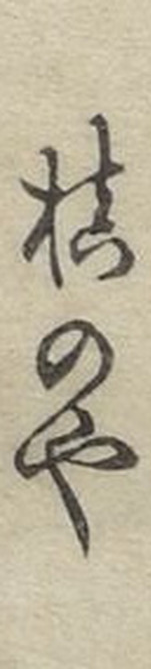槙のや
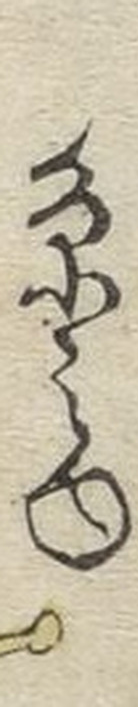糸みゆ
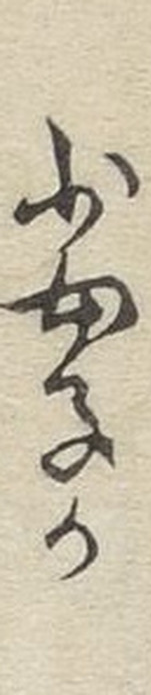少女子か
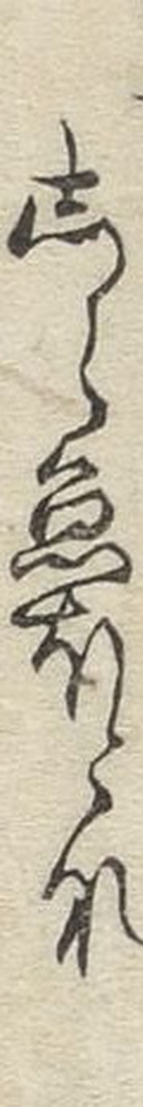しら魚ほとな
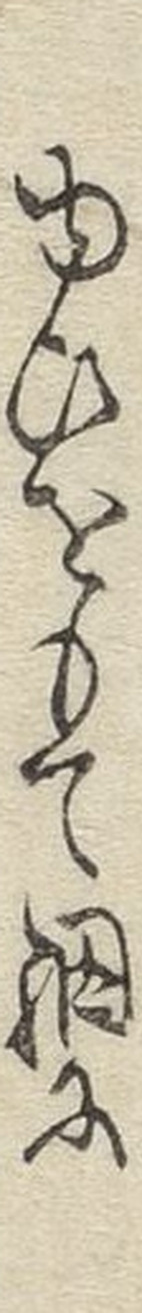ゆひをもて網に
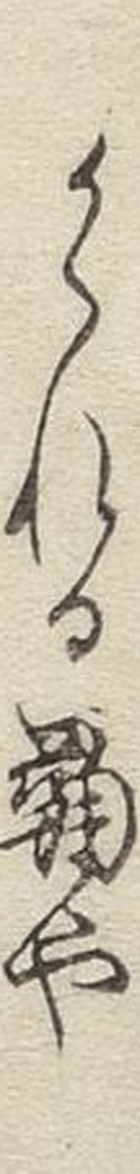かゝれる鞠や
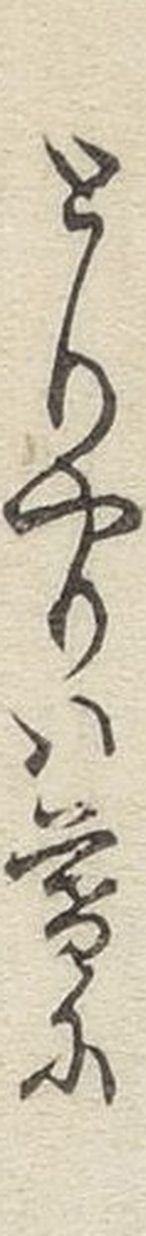とりやりは暮に
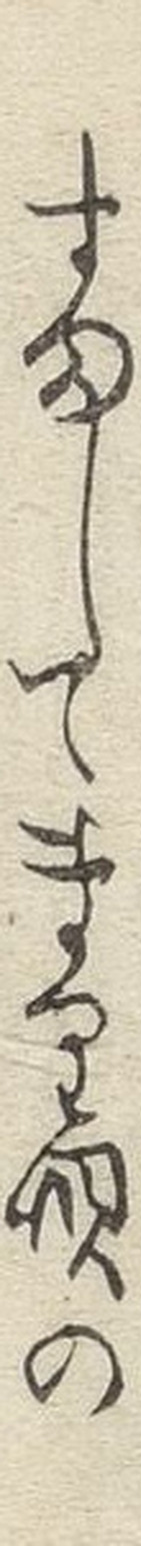すましてまり唄の
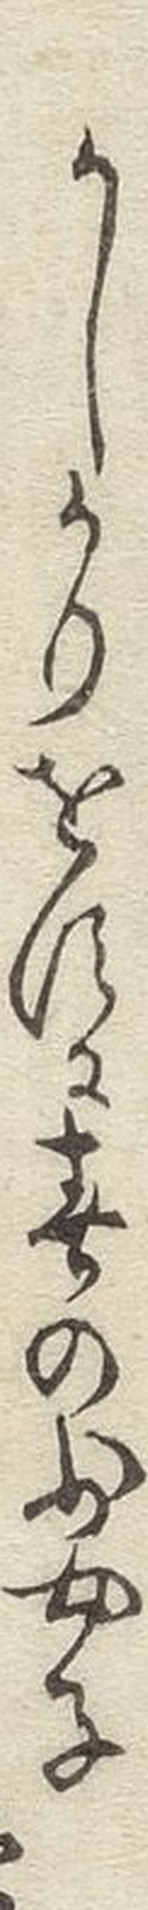かしかりをする春の少女子
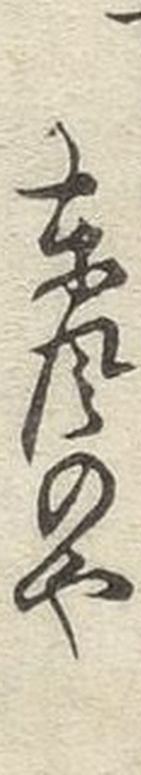東風のや
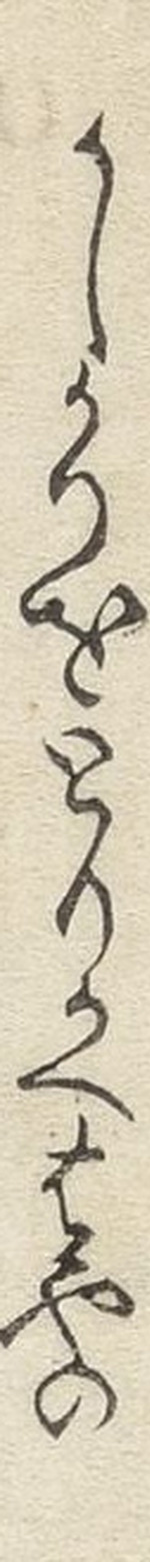かしかりをとりかへはやの
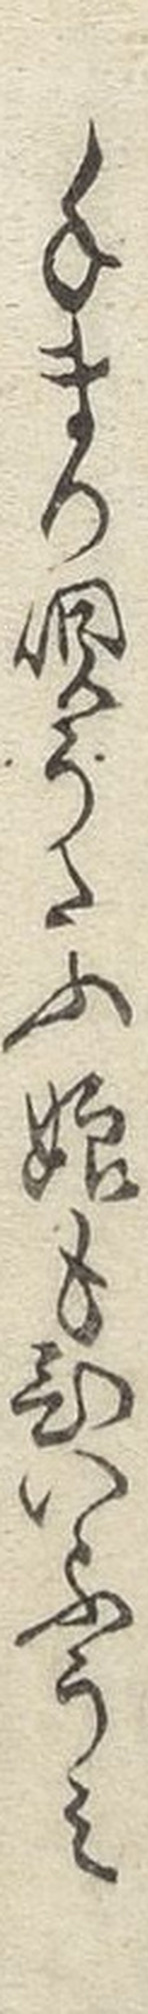手まり唄うたふ娘もひいふうみ
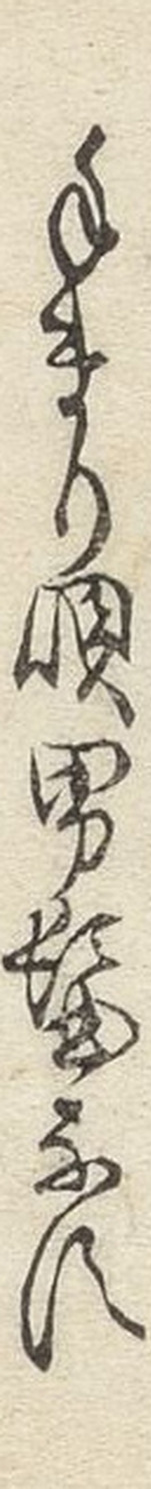手まり唄男髷なす
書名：Picture Album of People with Kyōka (Light Verse) (Kyōka shiki jinbutsu 狂歌四季人物)
